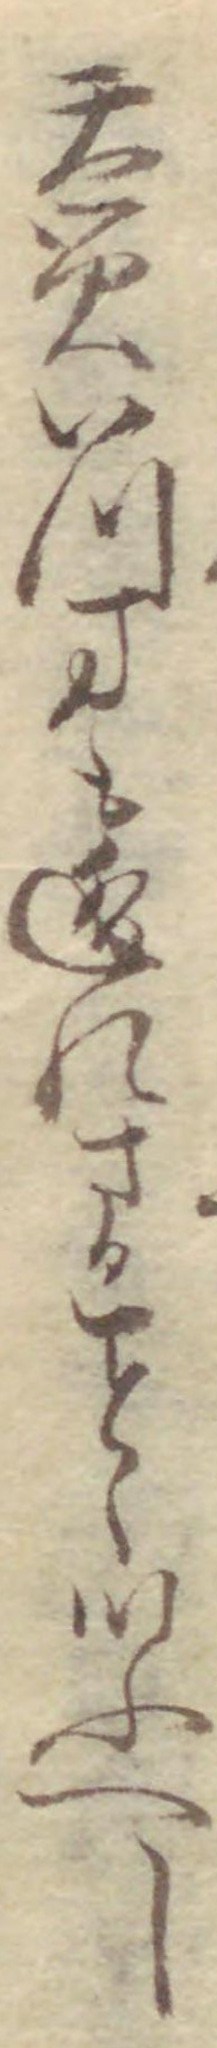天災いつ方も逃れさることゝいふへし
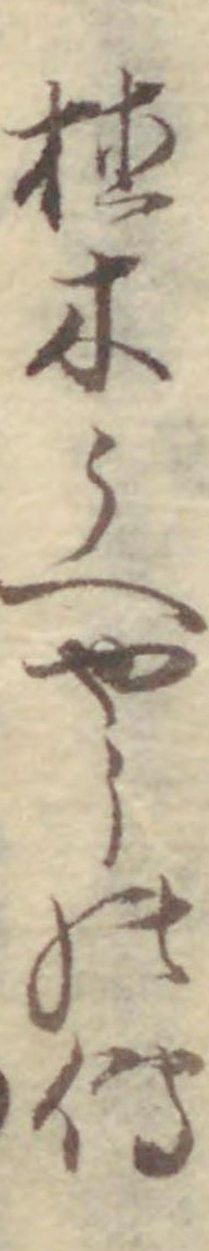植木うへやうの伝
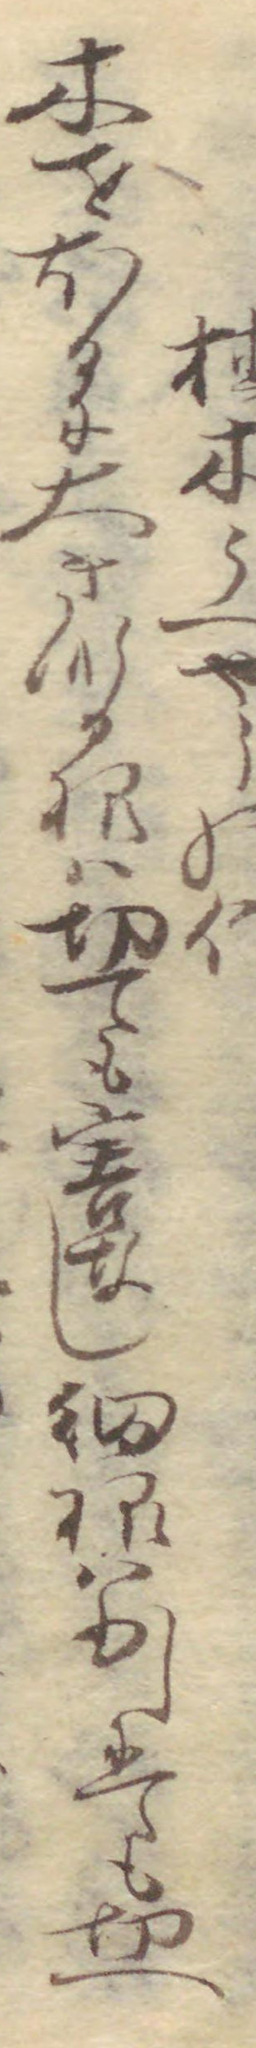木を切るに多きなる根ハ切ても害なし細根ハ少しにても切へ
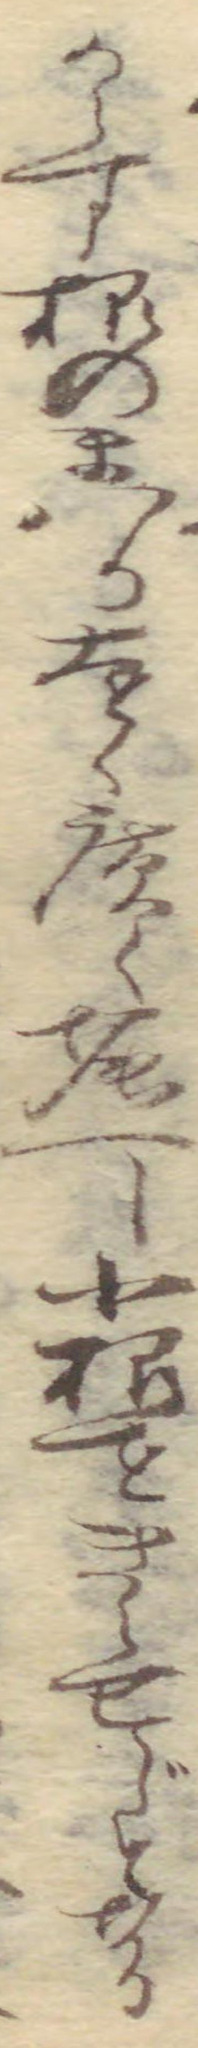からす根のまハり太とく広く堀へし小根をきらせじとなり
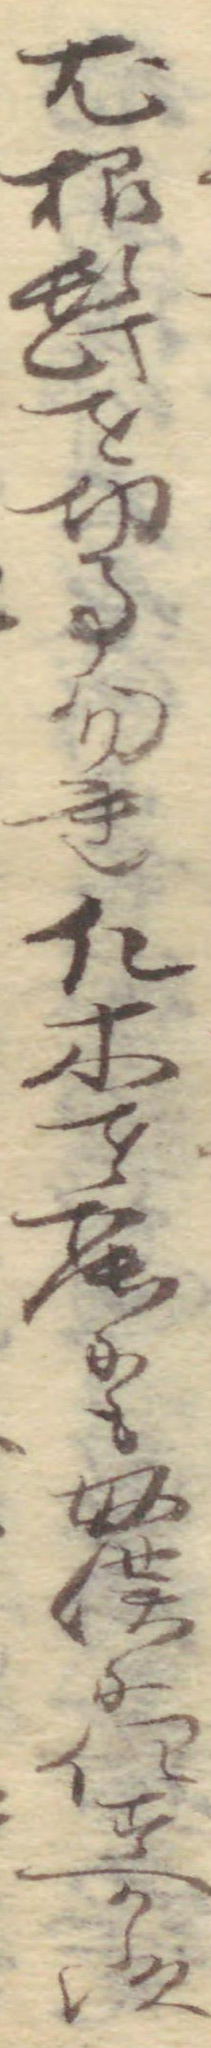尤根髭を切る勿れ凡木を堀にも奴僕に任すへからす
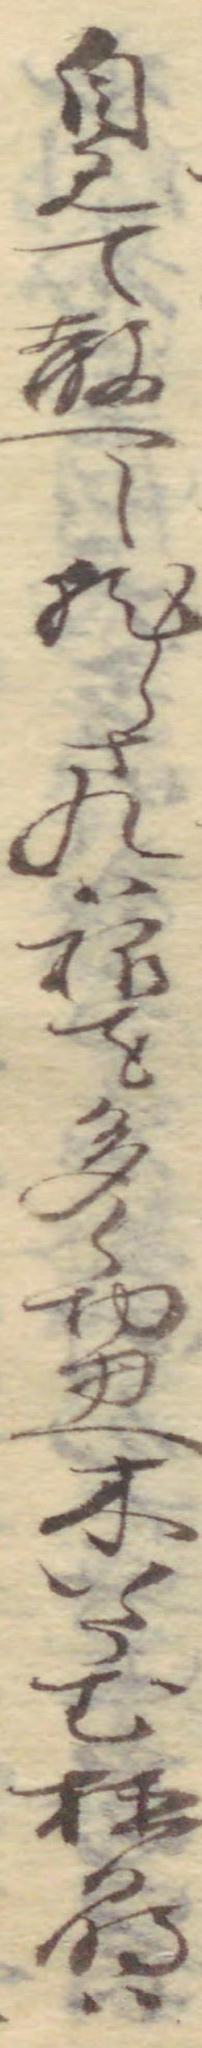自見て教へし然らされハ根を多く切ゆへ木いたむ植る時ハ
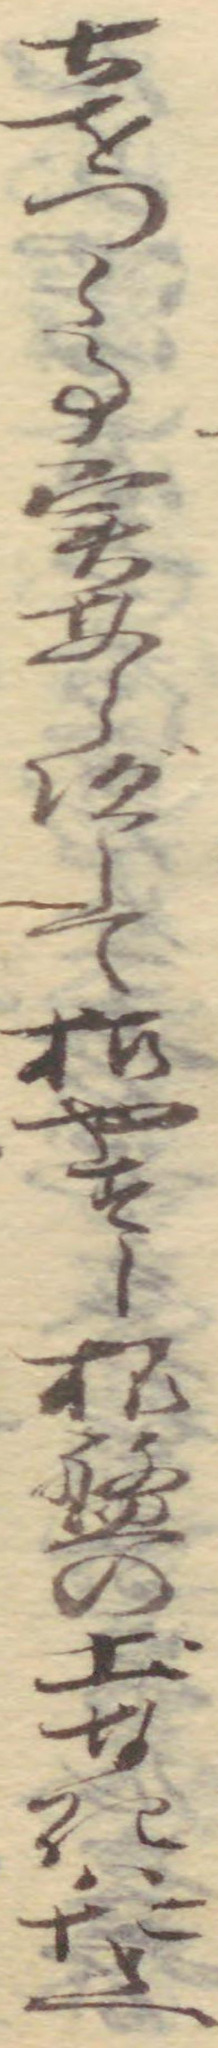土をつく事実ならずして枯やすし根盤の土なきハたとへ
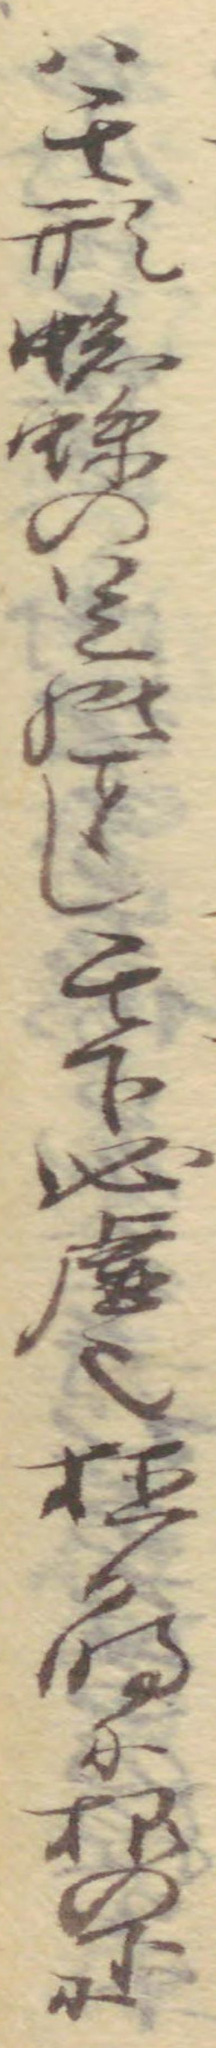ハ其形蜘蛛の足のことし其下必虚也植る時に根の下に
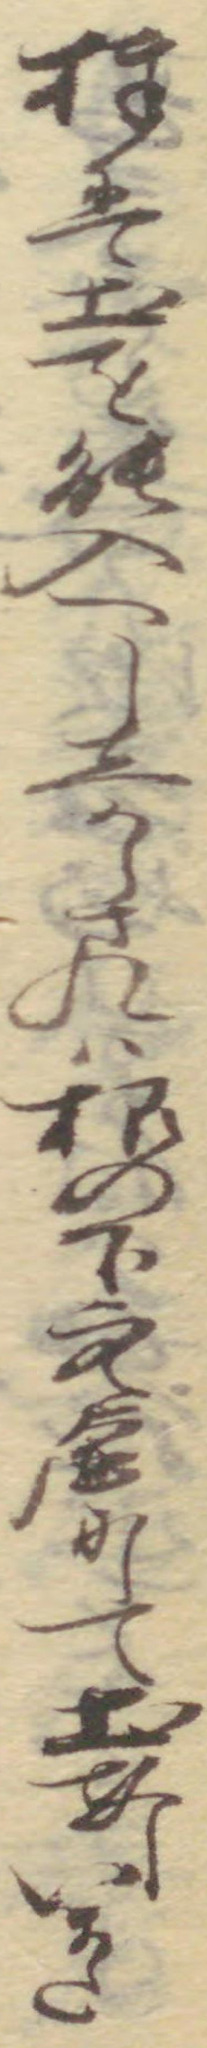棒にて土を能入へししからされハ根の下空虚にして土なしいまた
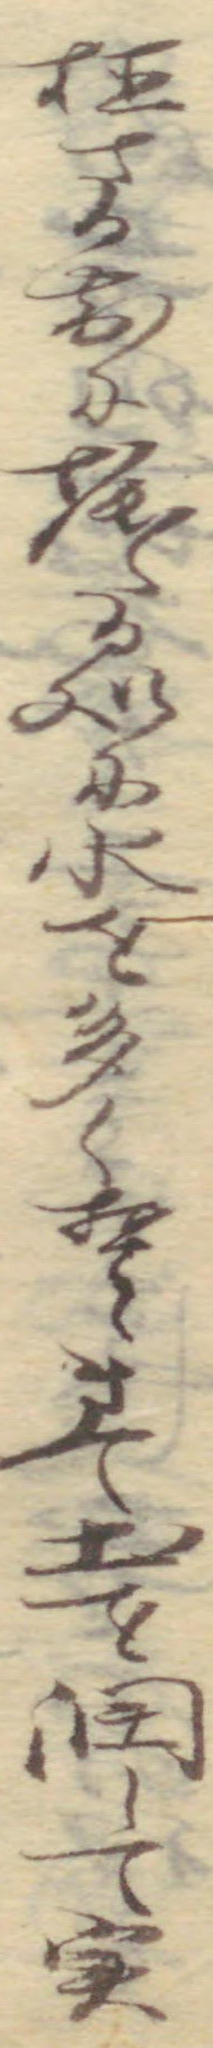植さる前に堀たる処に水を多くそゝきて土を潤して実
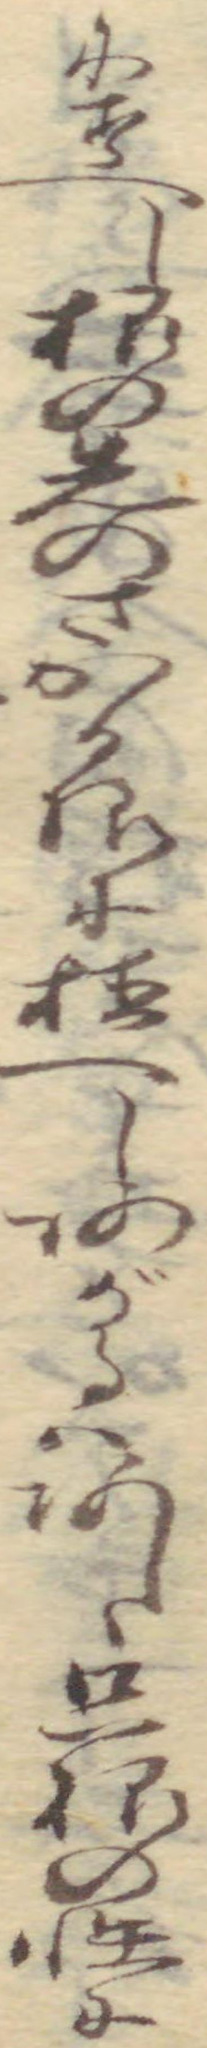にすへし根の先のさかる様に植へしあがるはあし也只根の性に
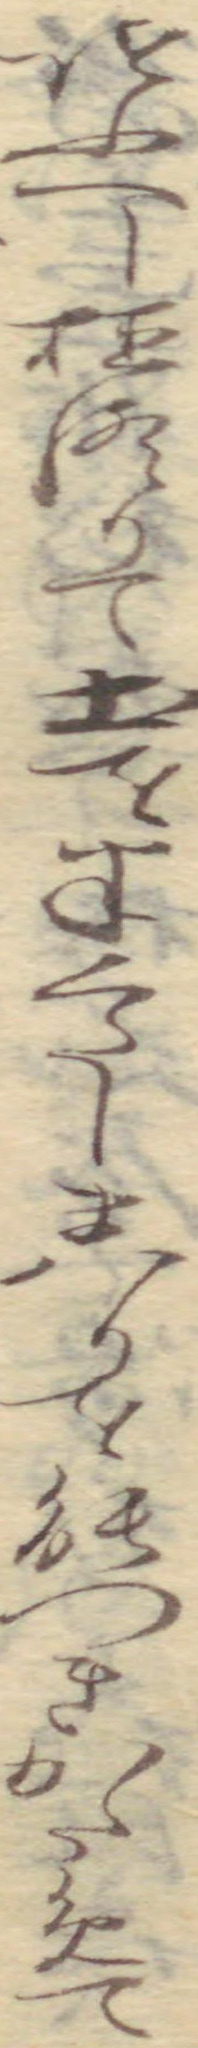従ふへし植終りて土を半くたしまハりを能つきかためて
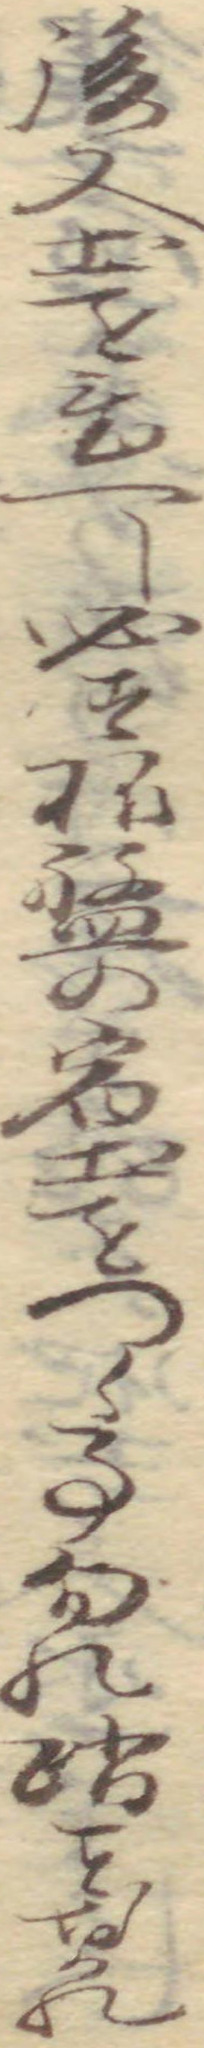後又土を置へし必す根盤の宿土をつく事勿れ踏ことなかれ
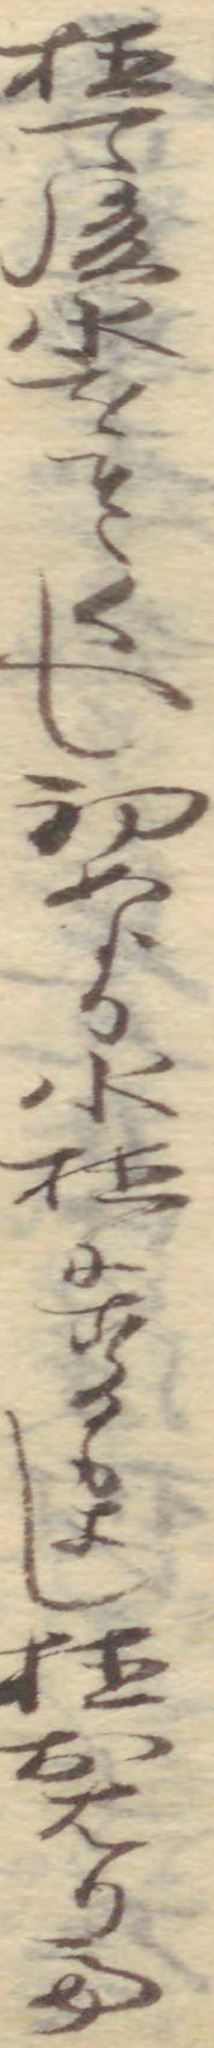植て後水をそゝくへし初めより水植にするもよし植おはりて
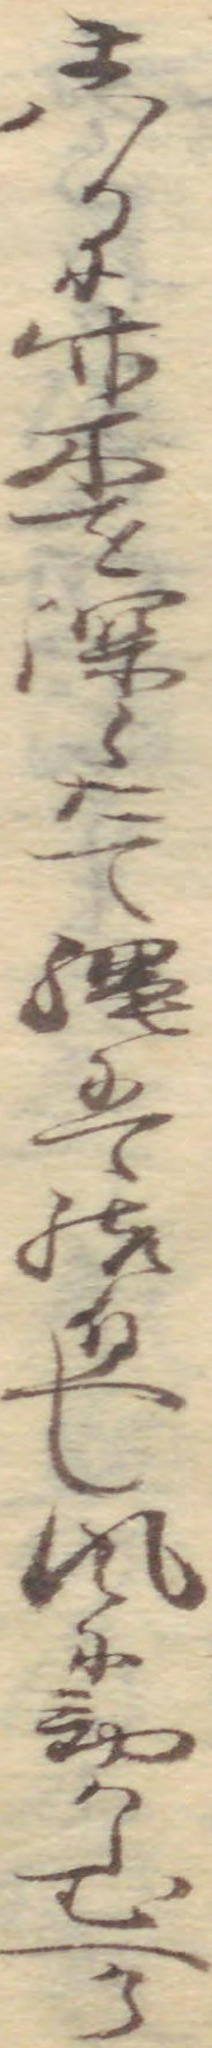まハりに竹木を深くたて縄にて結付へし風に動かしむへから
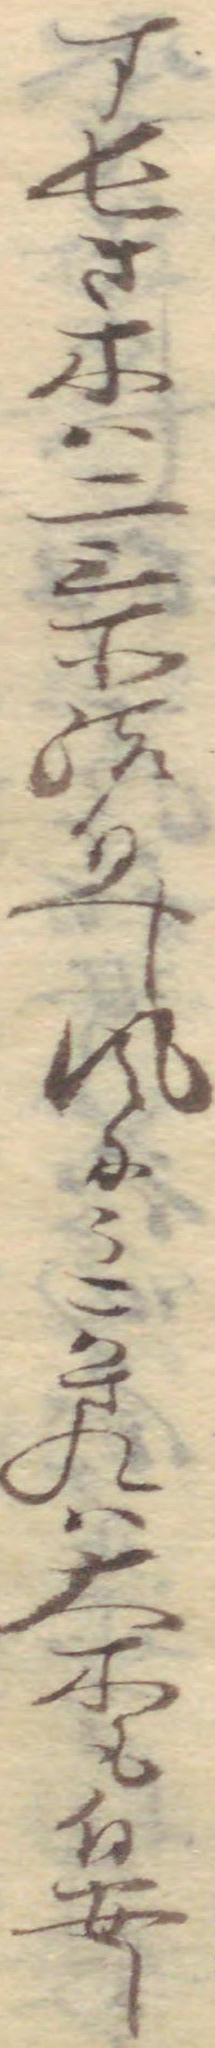す長き木ハ二三所結付へし風にうこかされハ大木も付安し
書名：鶯宿雑記. 巻199-200
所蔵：国立国会図書館 National Diet Library, JAPAN
